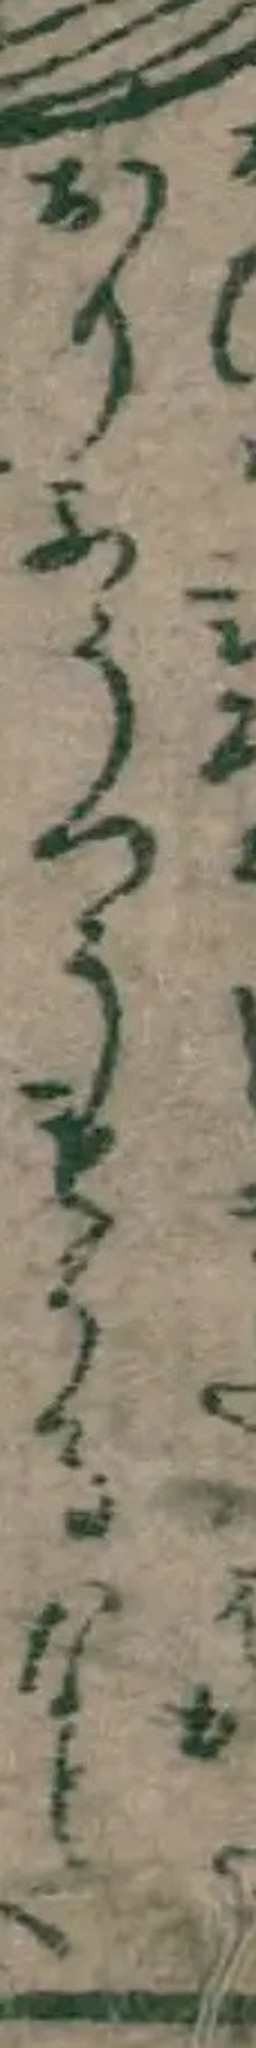おりふうつうもうるなとゝ
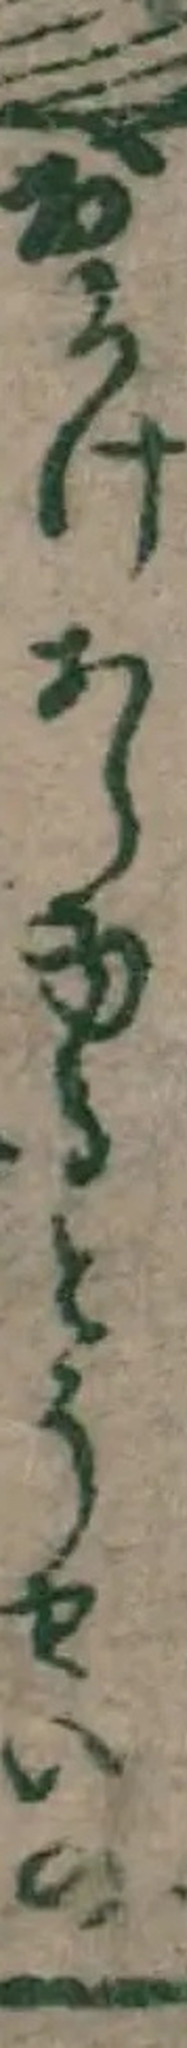出かけあらゆるとうせいの
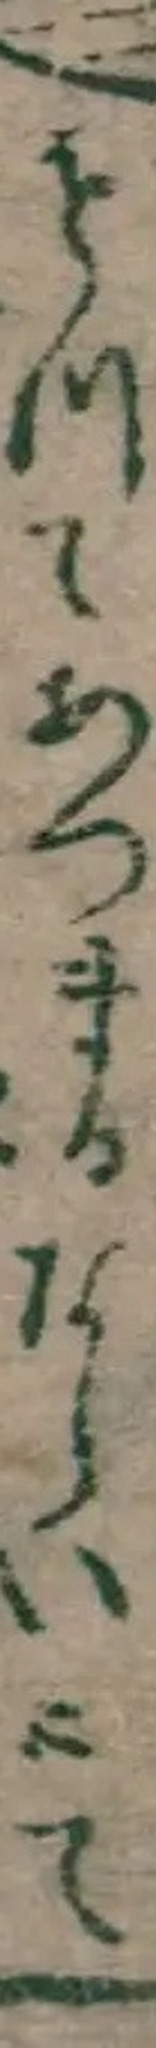もつてあつまるならいにて
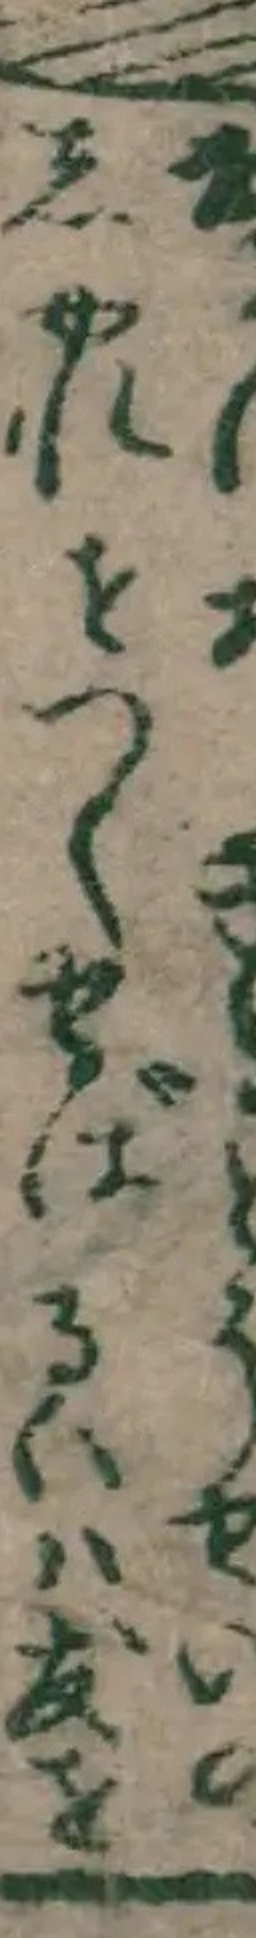しやれをつくせばるいは友を
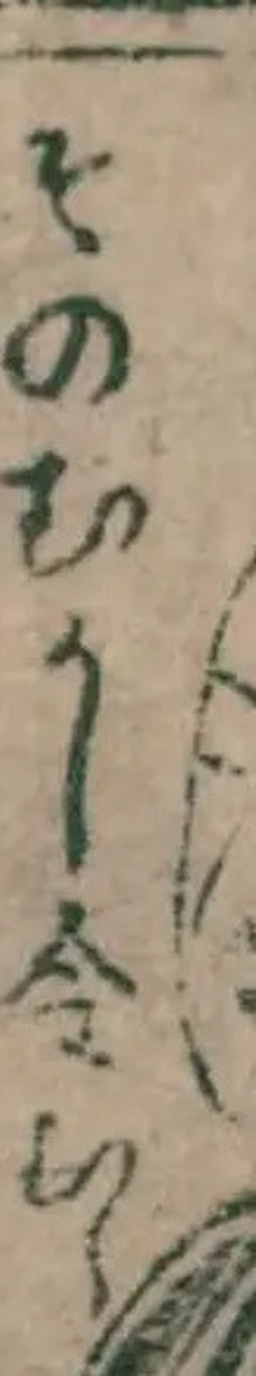そのむかし金むら
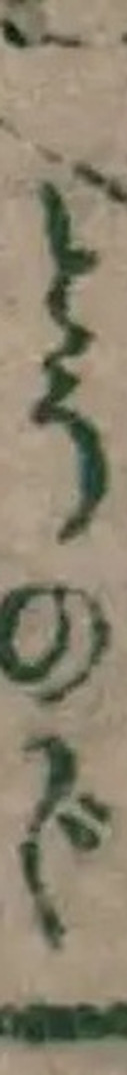とうのぐ
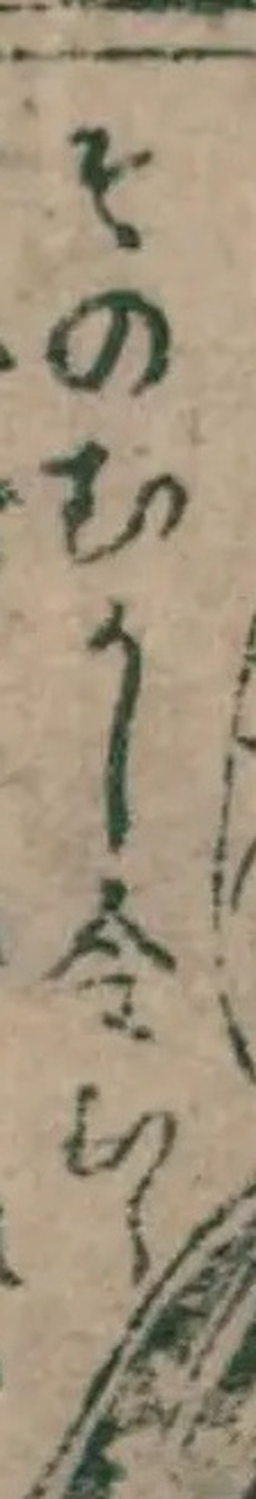そのむかし金むら
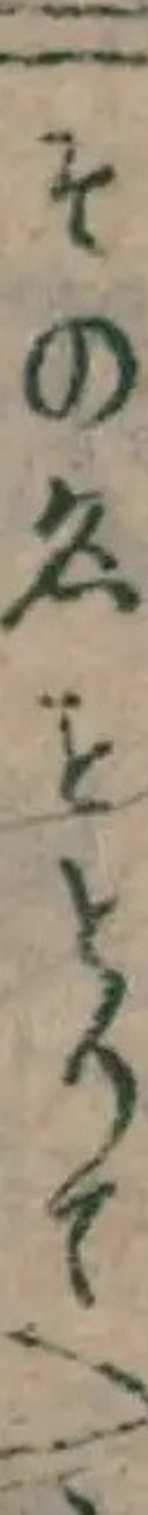その名をとりて
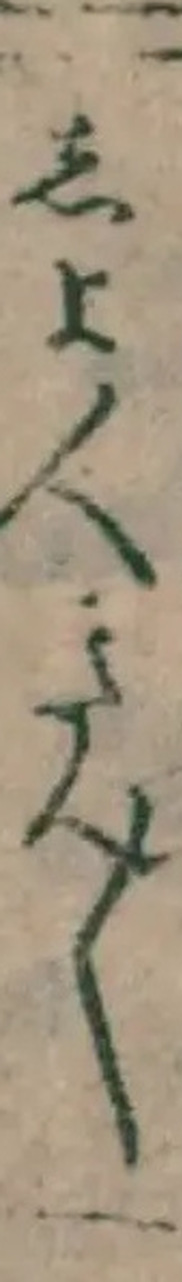しよ人きん〳〵
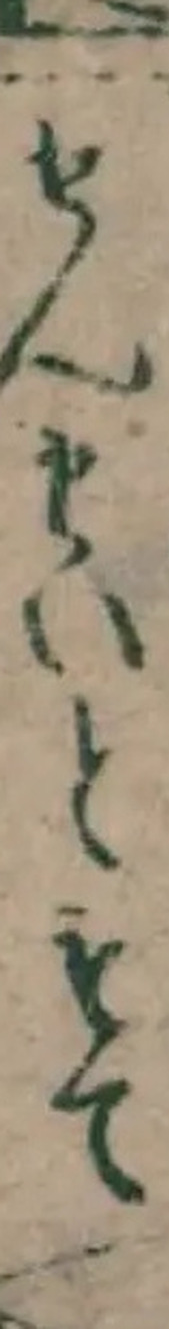せんせいともて
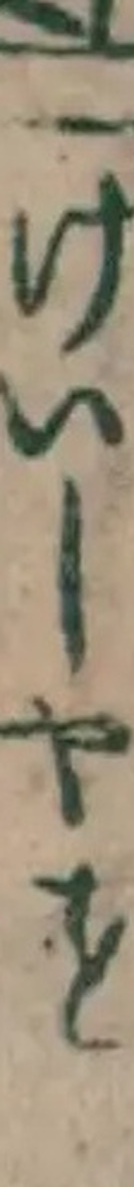げいしやを
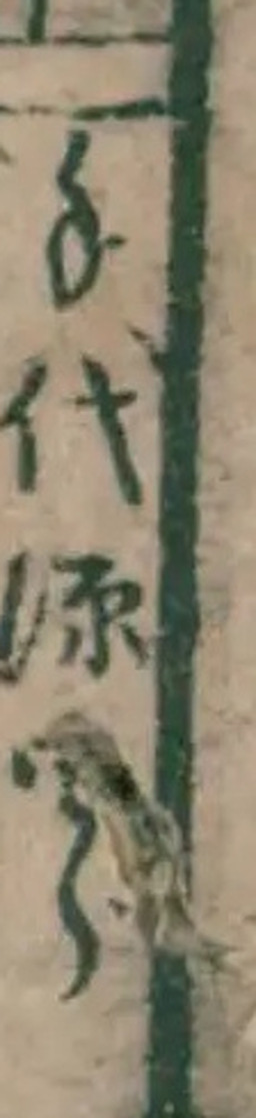手代源四郎
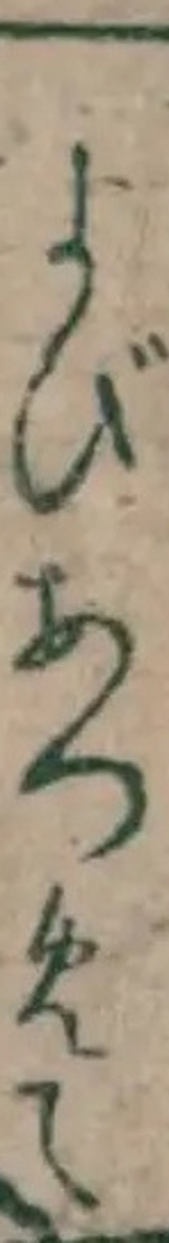よびあつめて
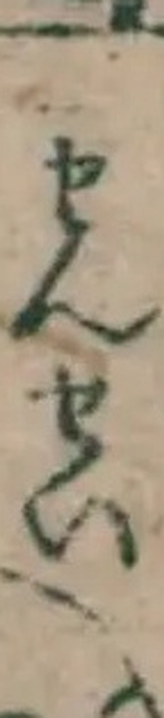せんせい
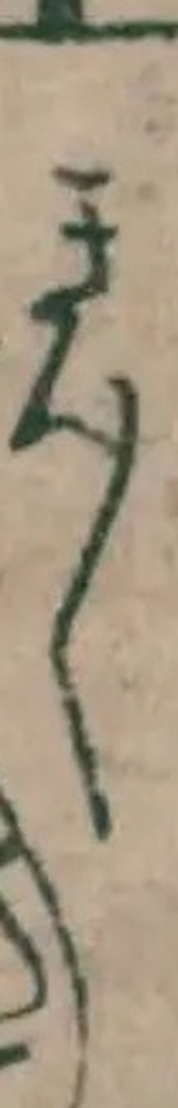きん〳〵
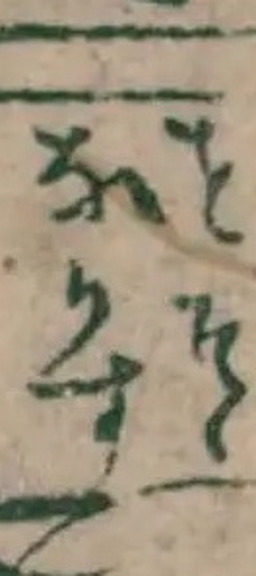なかす
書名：金々先生栄花夢 : 2巻
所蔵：国立国会図書館 National Diet Library, JAPAN
